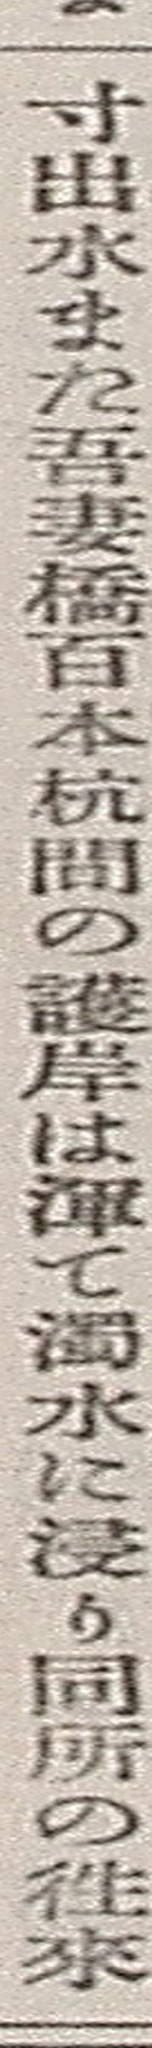寸出水また吾妻橋百本杭間の護岸は渾て濁水に浸り同所の往来
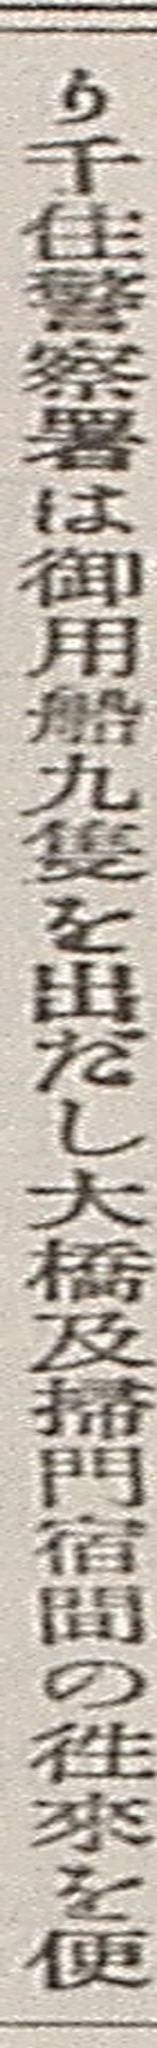り千住警察署は御用船九隻を出だし大橋及掃門宿間の往来を便
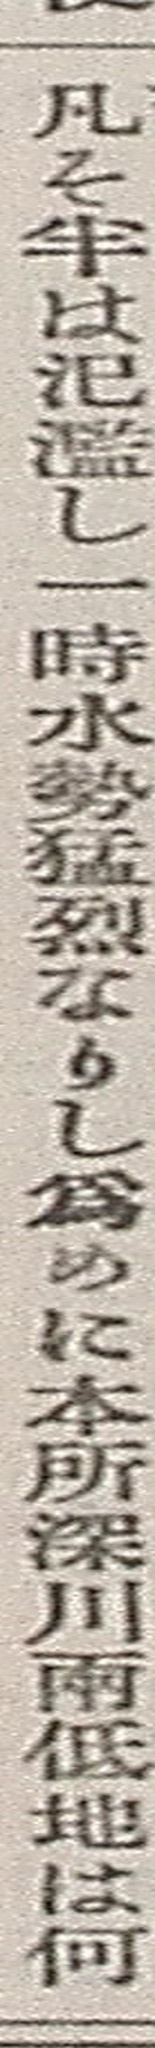凡そ半は氾濫し一時水勢猛烈なりし為めに本所深川両低地は何
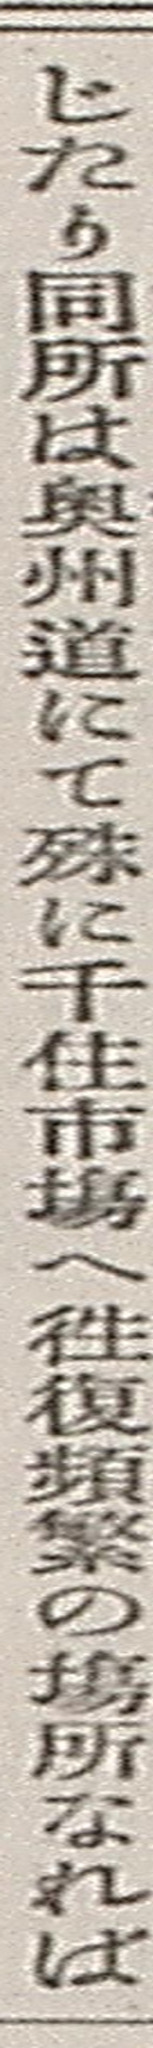じたり同所は奥州道にて殊に千住市場へ往復頻繁の場所なれば
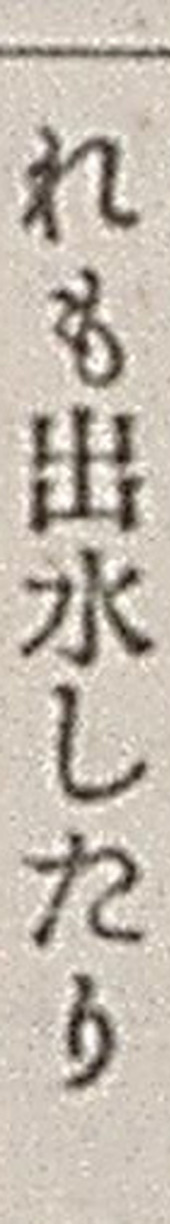れも出水したり
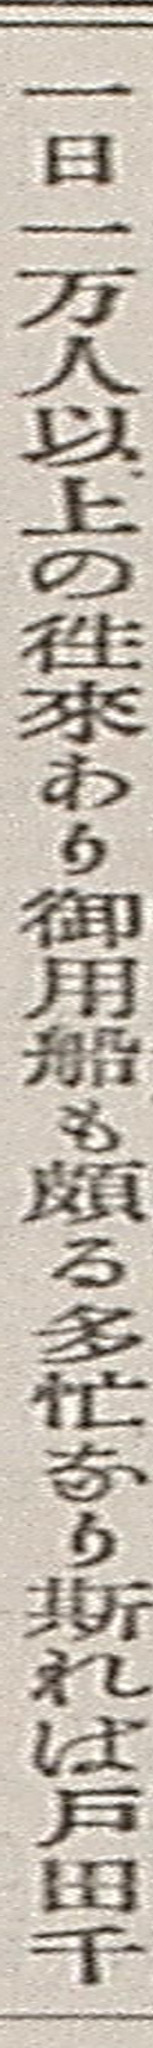一日一万人以上の往来あり御用船も頗る多忙なり斯れば戸田千
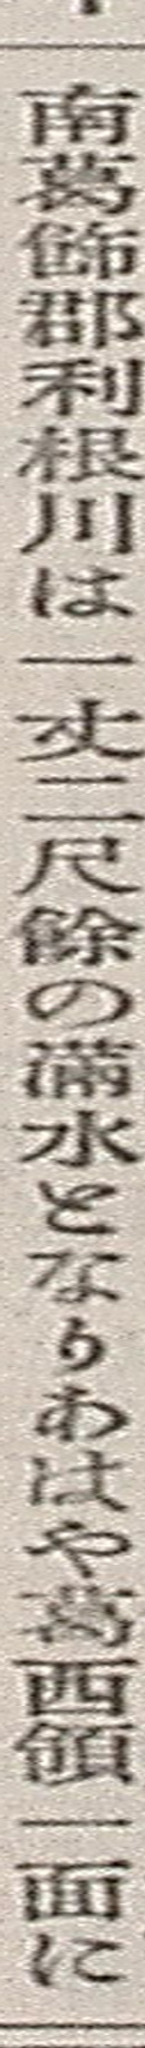南葛飾郡利根川は一丈二尺余の満水となりあはや葛西領一面に
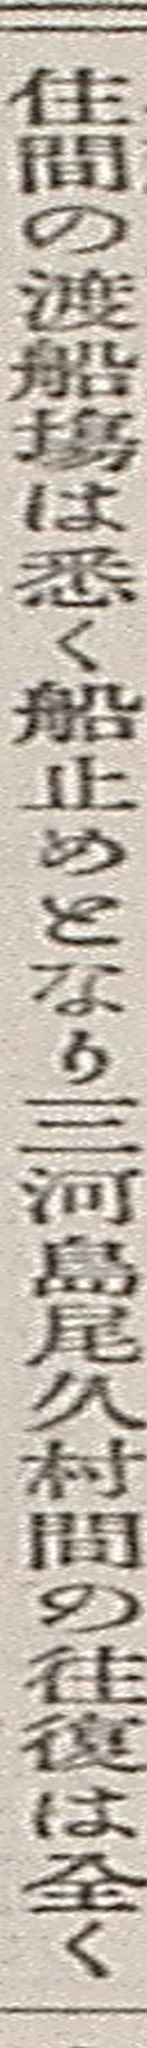住間の渡船場は悉く船止めとなり三河島尾久村間の往復は全く
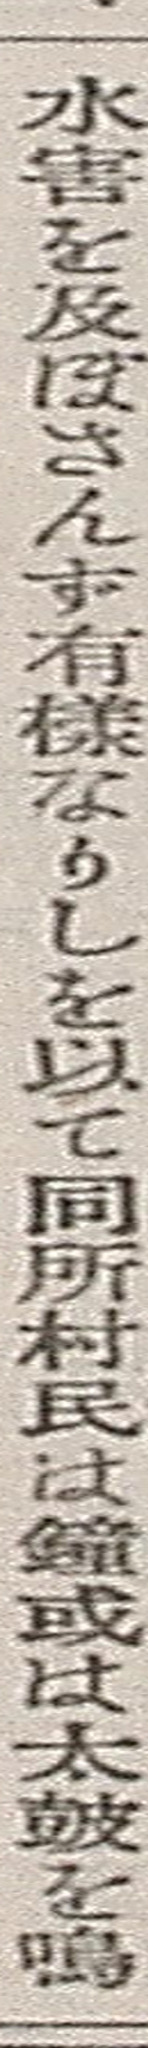水害を及ぼさんず有様なりしを以て同所村民は鐘或は太鼓を鳴
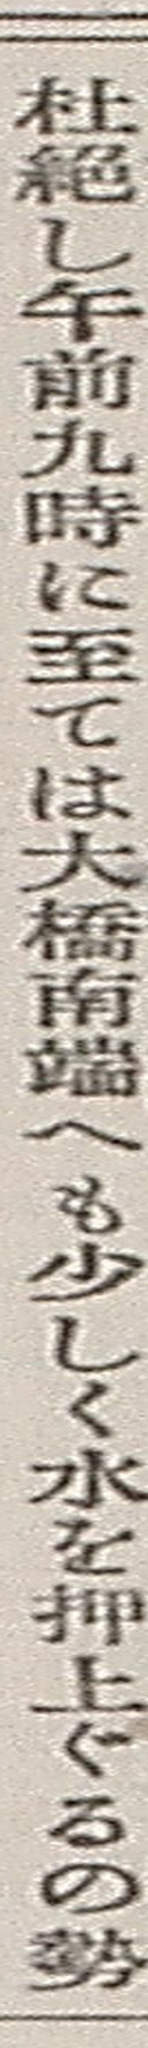杜絶し午前九時に至りては大橋南端へも少しく水を押上ぐるの勢
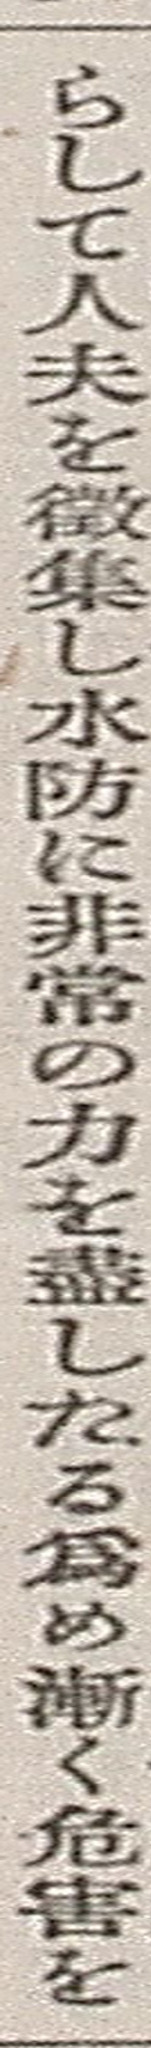らして人夫を徴集し水防に非常の力を尽したる為め漸く危害を
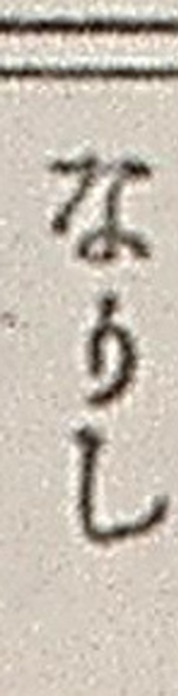なりし
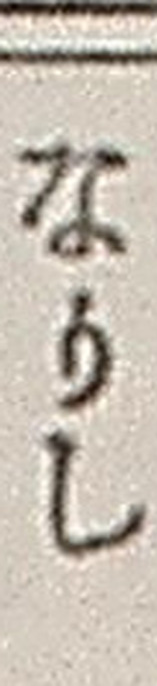なりし
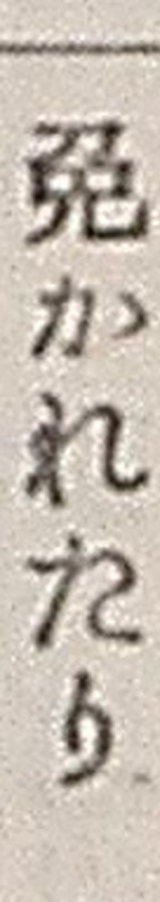免かれたり
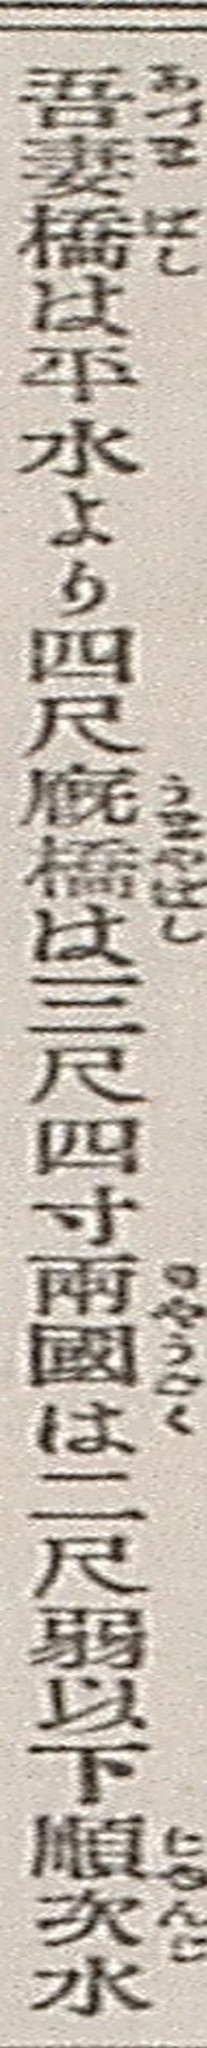吾妻橋は平水より四尺厩橋は三尺四寸両国は二尺弱以下順次水
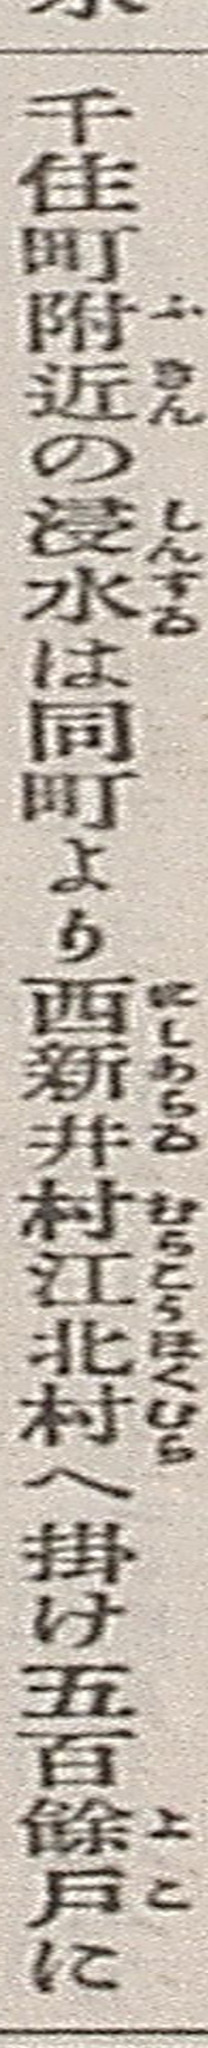千住町附近の浸水は同町より西新井村江北村へ掛け五百余戸に
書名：風俗畫報臨時増刊第百二十四號　洪水地震被害録（上）
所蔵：東京大学地震研究所図書室 Earthquake Research Institute Library, The University of Tokyo, JAPAN
